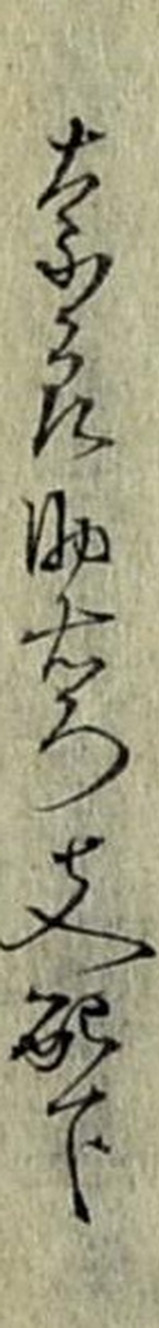奈良助右衛門支配下
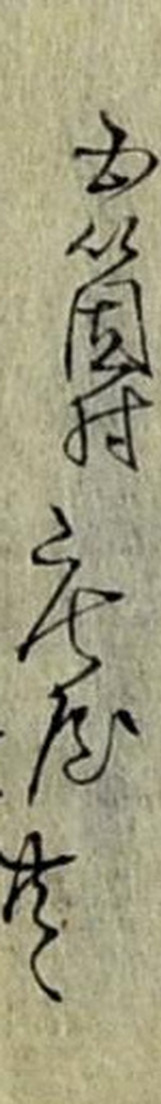五箇村庄屋共へ
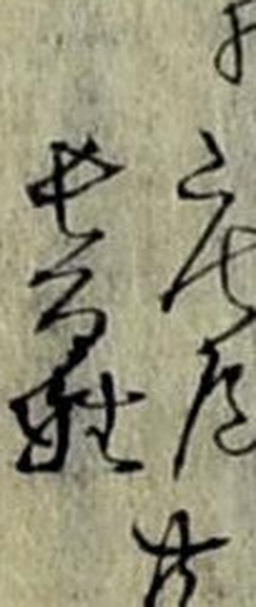長百姓
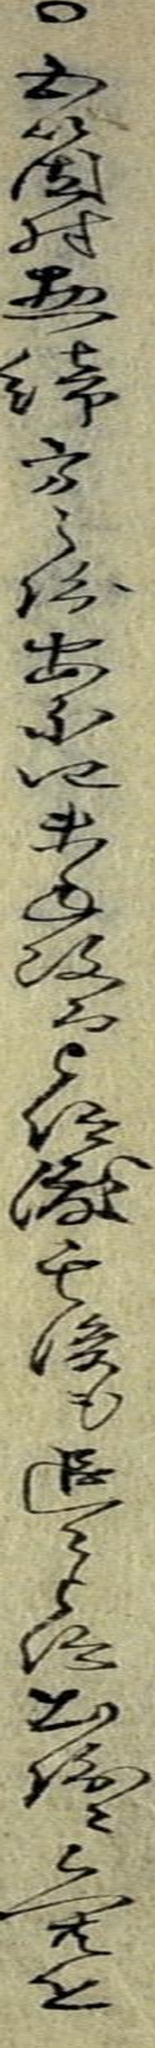○五箇村惣締方之儀安永四未年改而被仰渡其後も追々被仰出儀ニ候へ共近
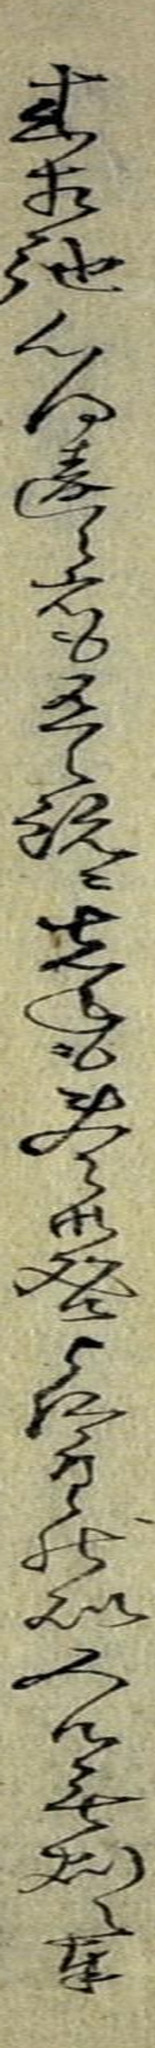来相弛心得違之者も有之既ニ先年も御咎被仰付候然処又候無判之奉
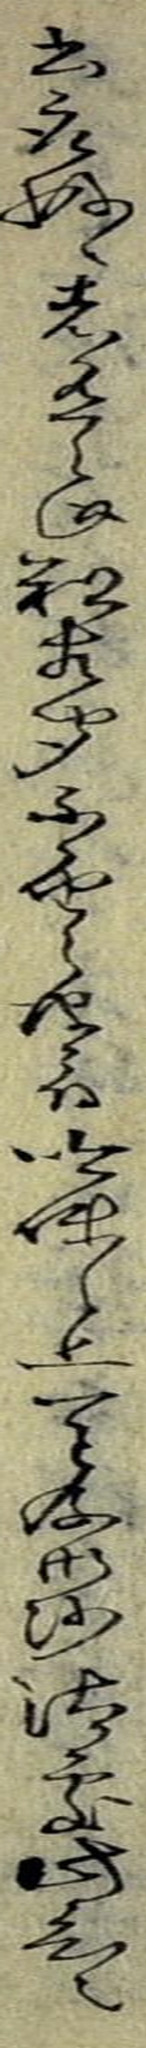書取扱候者有之趣粗相聞不届之儀ニ付吟味之上可被及御沙汰処此度之
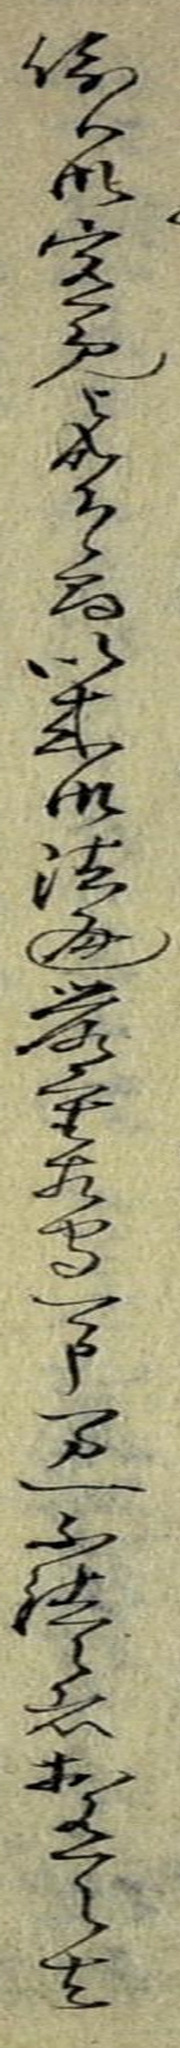儀ハ御宥免被成下候間以来御法通厳重相守可申万一不法之者於有之者
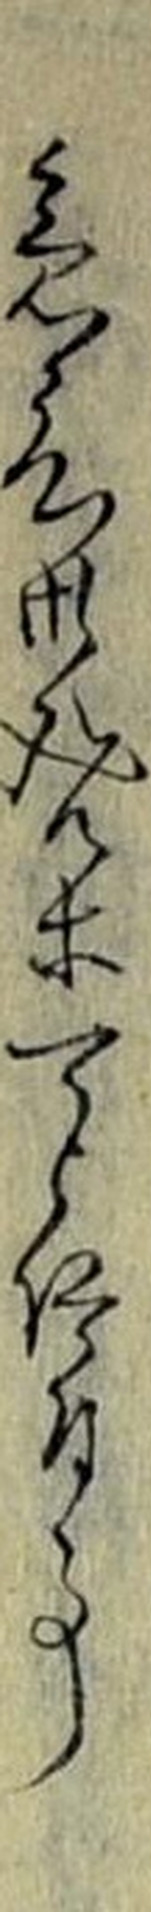急度御咎等可被仰付事
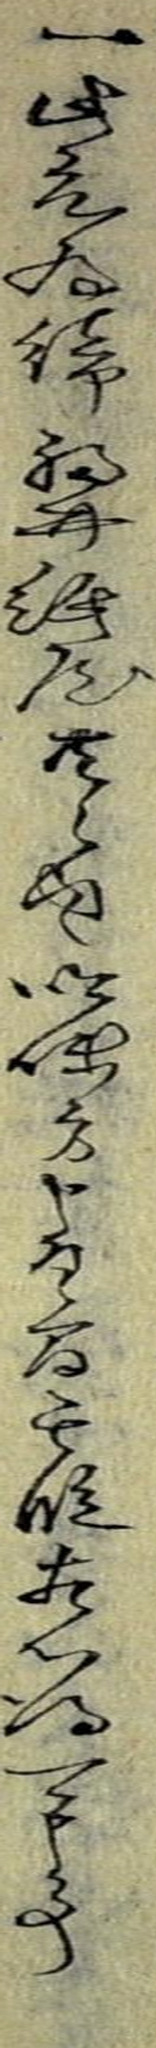一此度為締福井紙屋共之内へ吟味方申付候間其段相心得可申事
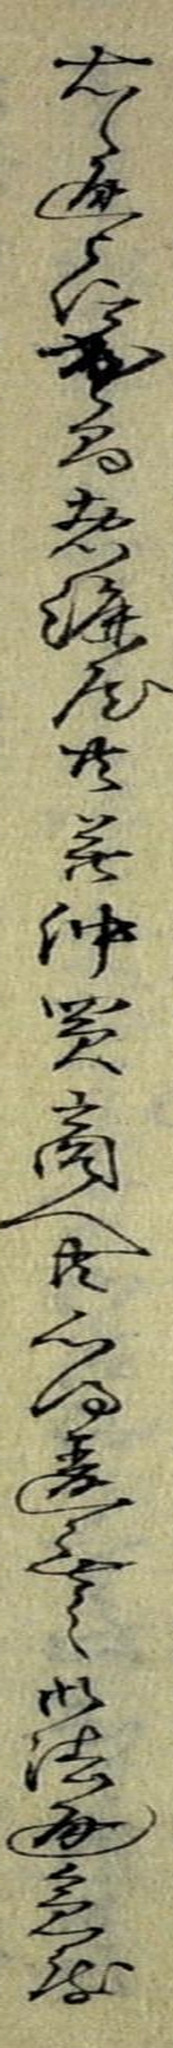右之通被仰出候間惣漉屋共并仲買商人共心得違無之御法通急度
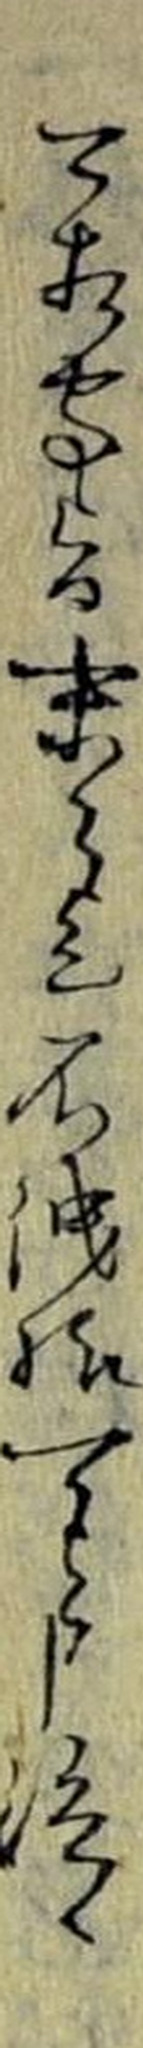可相守旨末々迄不洩様可被申渡候
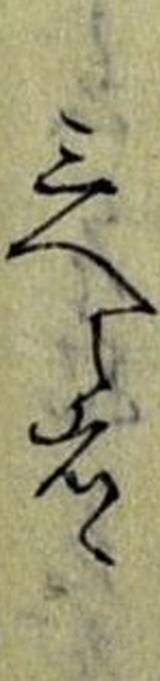三人之者へ
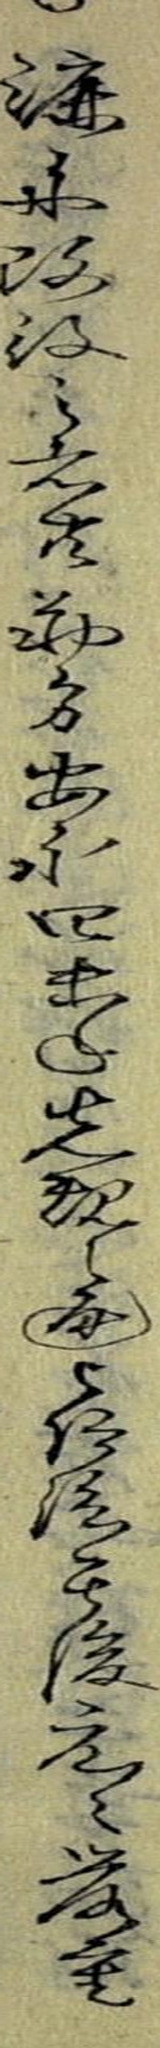○漉舟改役之者共勤方安永四未年先規之通被仰渡其後元々厳重
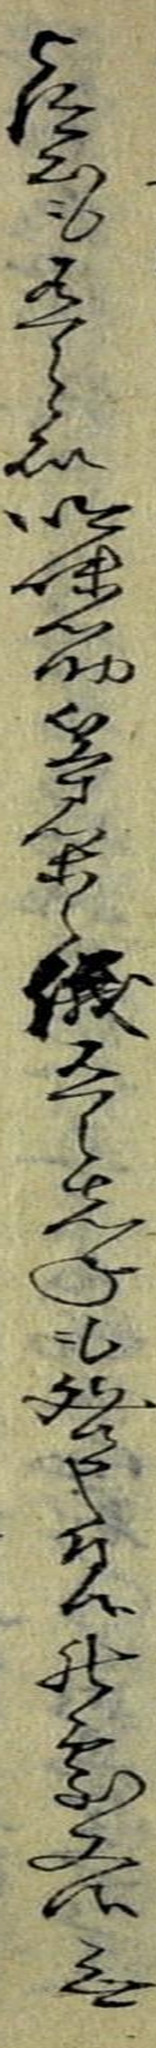被仰出も有之候処吟味筋等閑之儀有之先年も咎申付候然処又候無
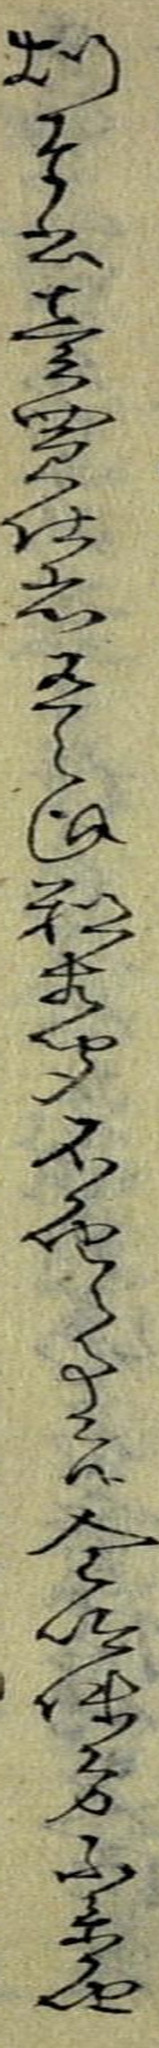判奉書売買仕者有之趣粗相聞不届之事ニ候全吟味方不参届
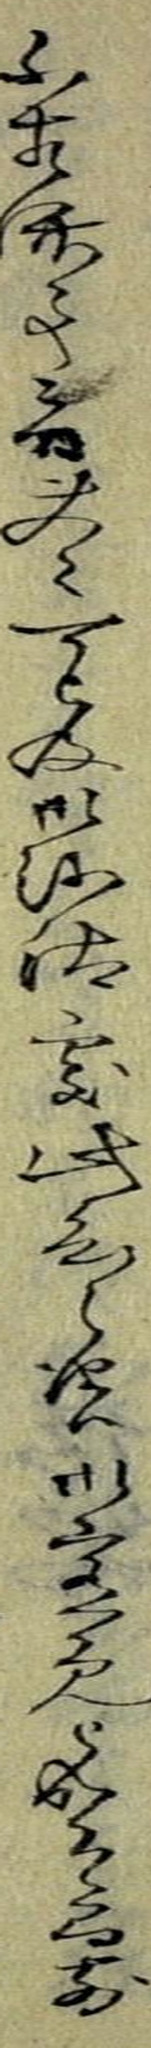不相済事ニ付夫々可被及御沙汰候処此度御宥免被成下候間前
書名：命令之部 五
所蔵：福井県文書館 Fukui Prefectural Archives
